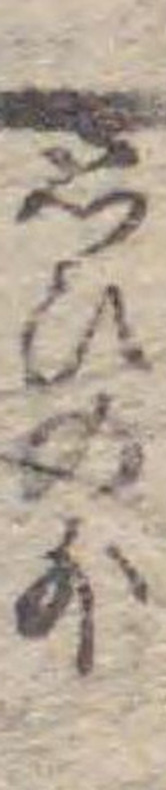思ひの外
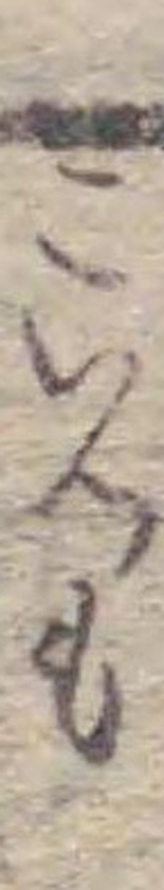こいつも
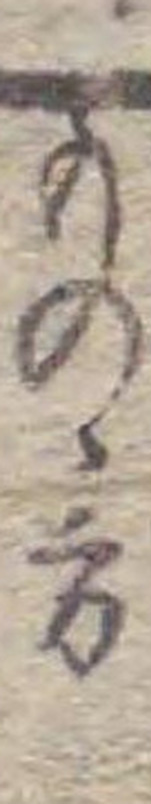ものゝ方
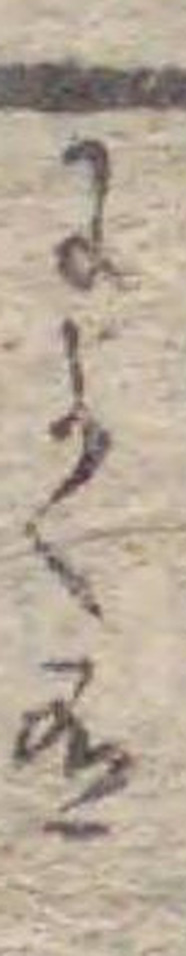によく有
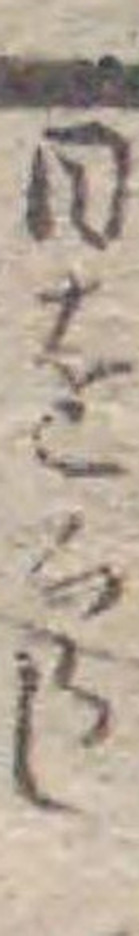日をくらし
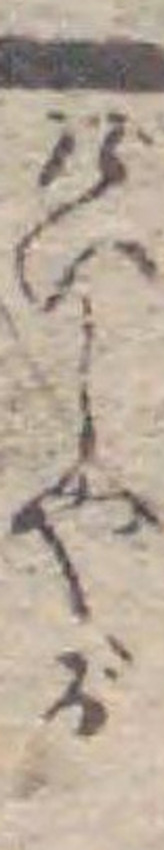げいしやが
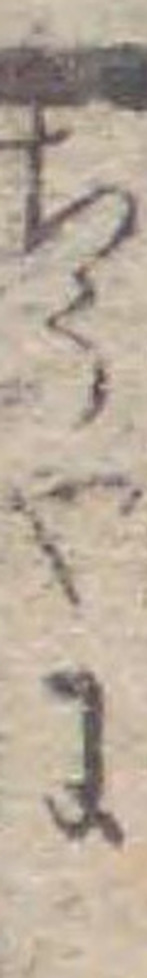ちうやに
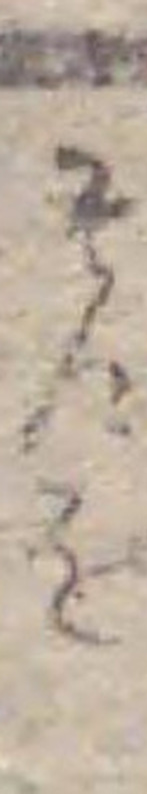そんを
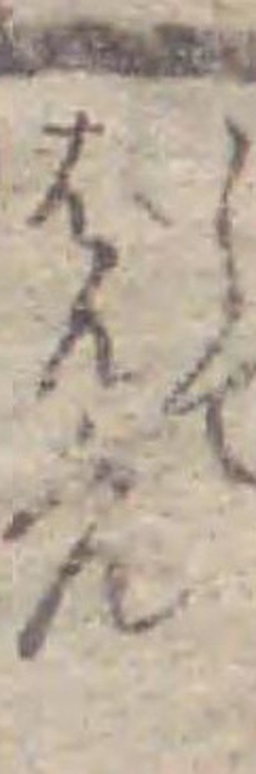はんふん
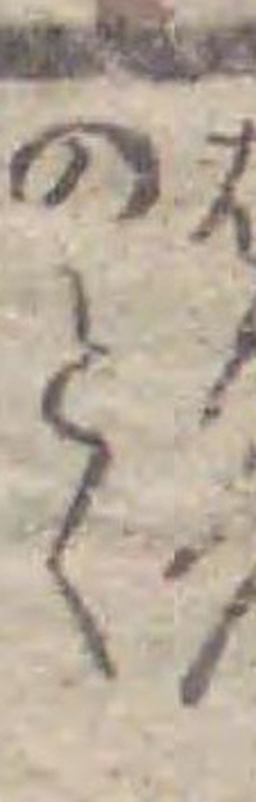のとく

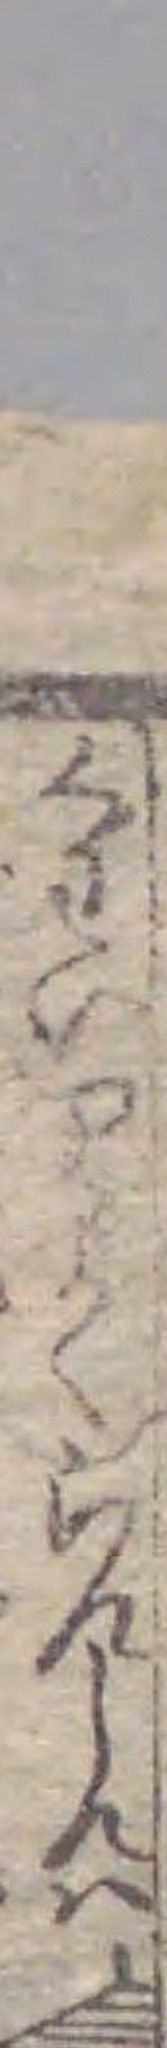くわいりよくらんしんは
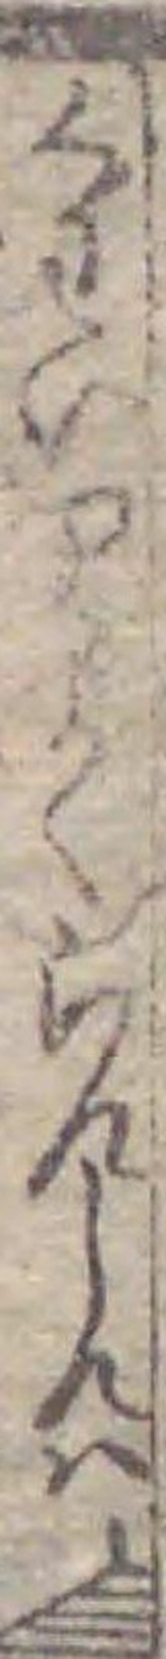くわいりよくらんしんは
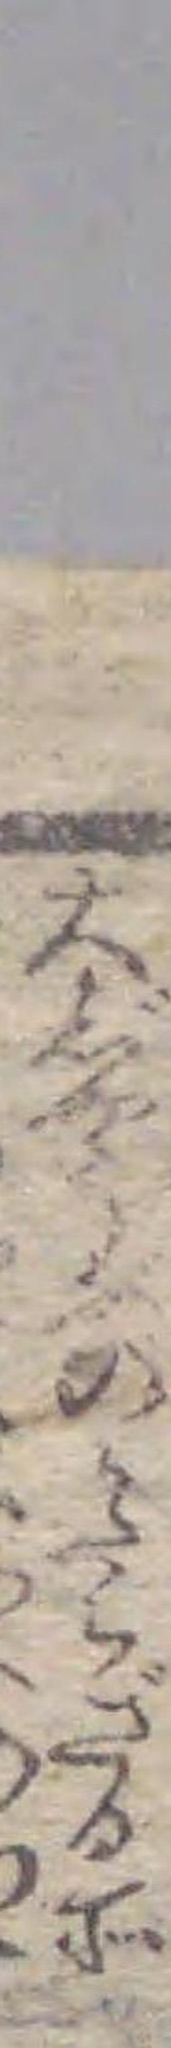大じやうぶのかたらざる所
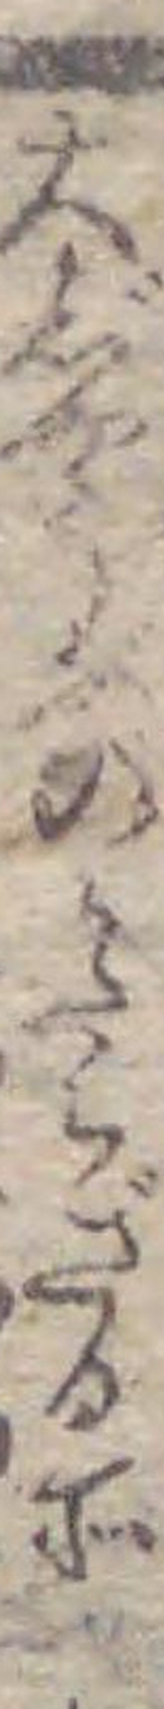大じやうぶのかたらざる所
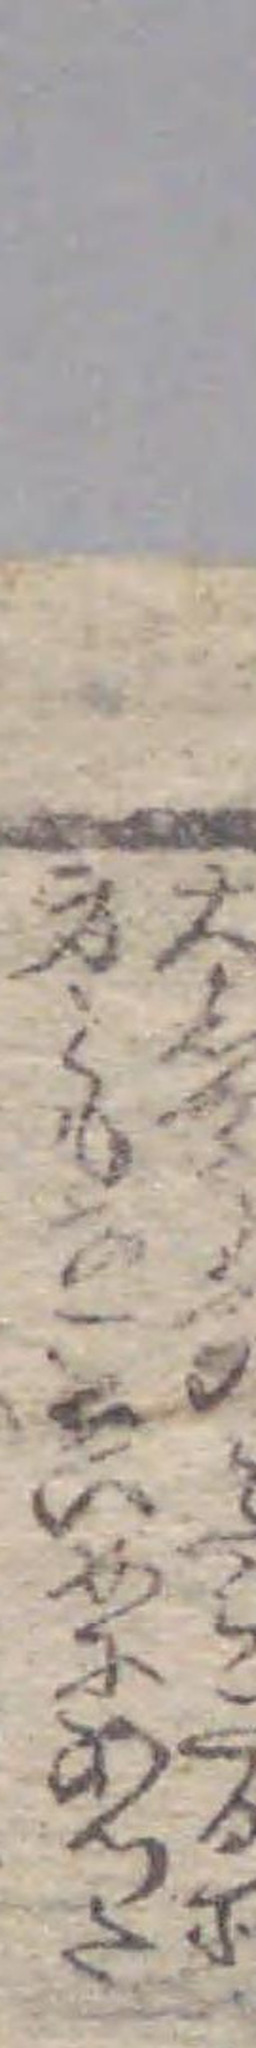身ともなこはいめにあつた
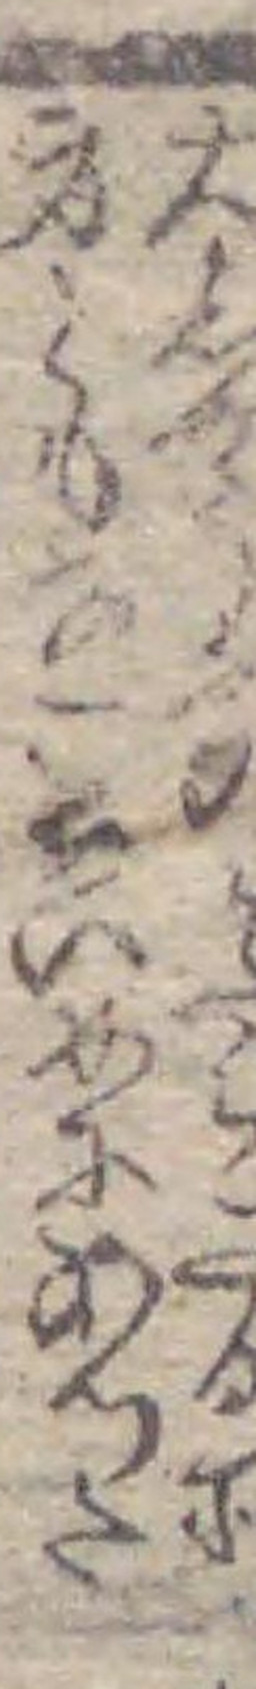身ともなこはいめにあつた
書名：紺屋百物語 : 3巻
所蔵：国立国会図書館 National Diet Library, JAPAN
